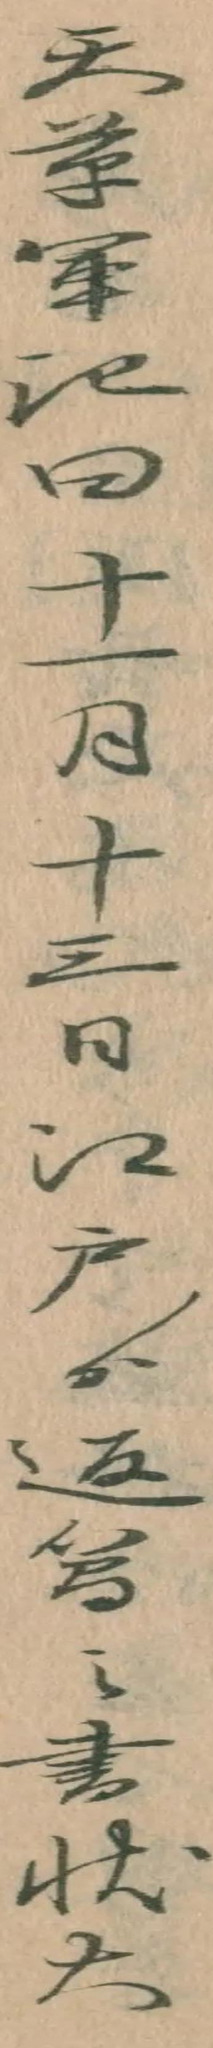天草軍記曰十一月十三日江戸ゟ返簡之書状大
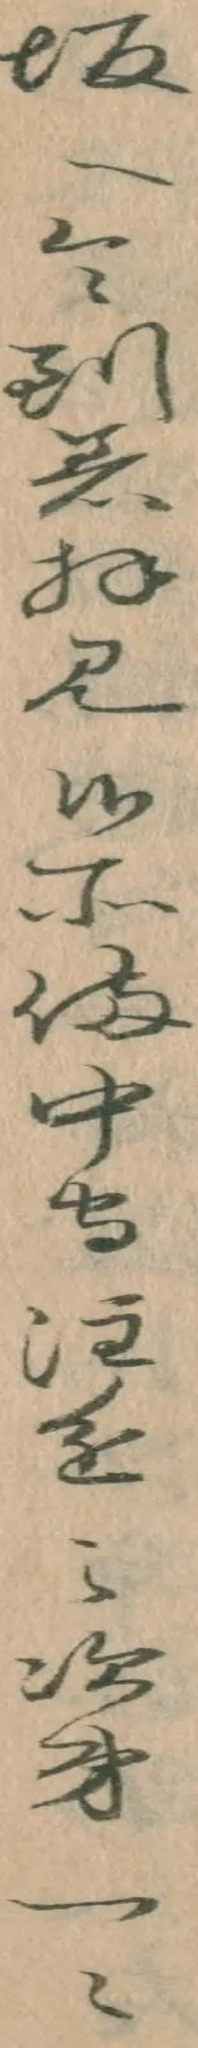坂へ令到着拝見候所備中守注進之次第一々
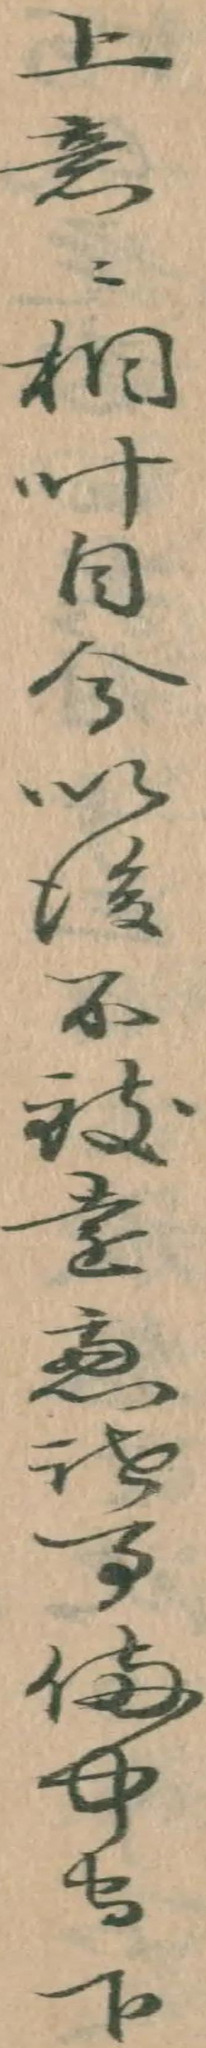上意に相叶自今以後不致遠慮諸事備中守下
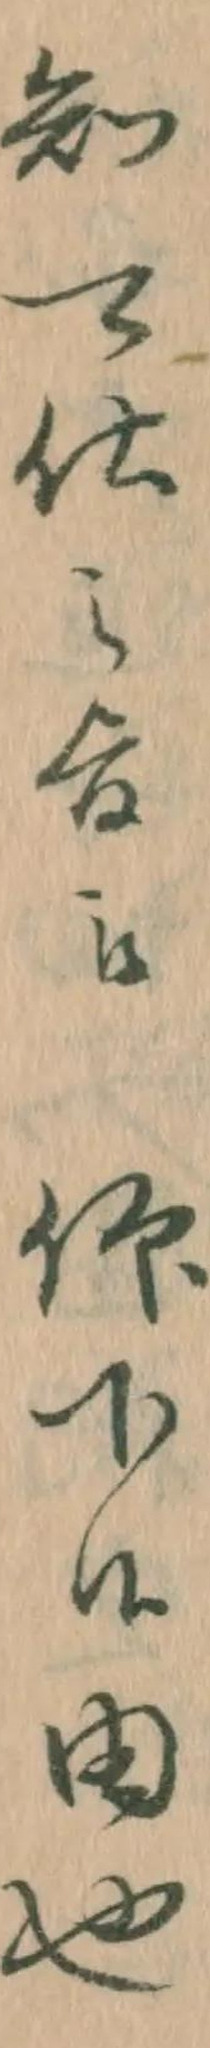知可仕之旨被仰下候由也
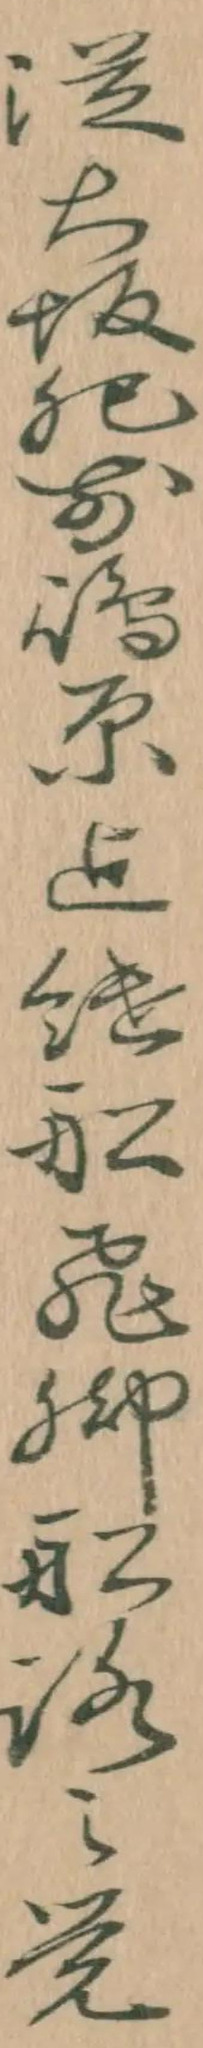従大坂肥前島原迄鑓舩飛脚舩路之覚
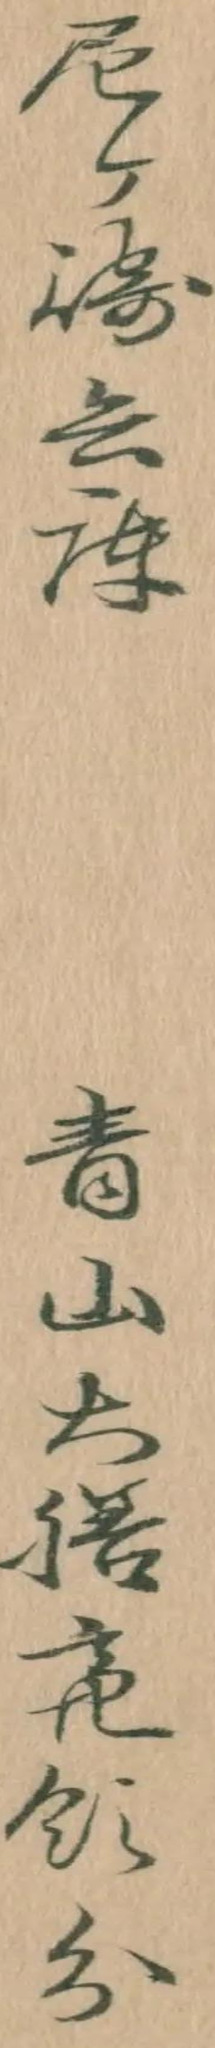尼け崎兵庫青山大膳亮領分
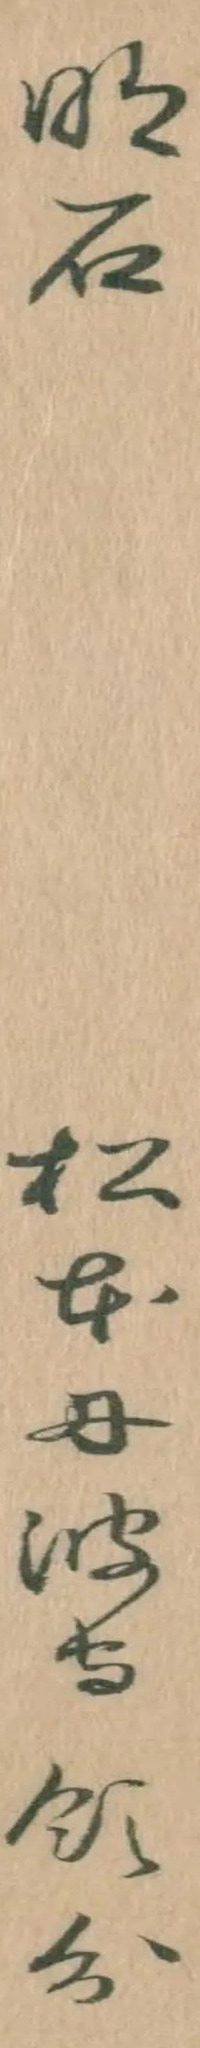明石松本丹波守領分
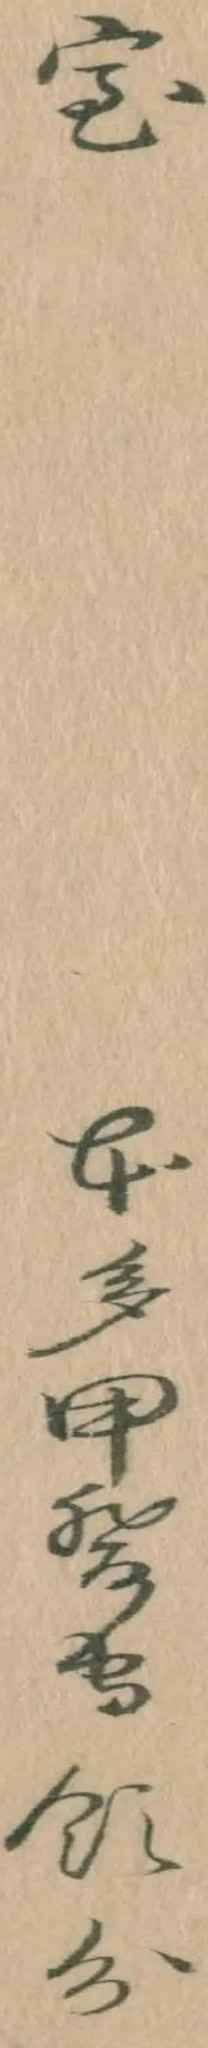宝本多甲斐守領分
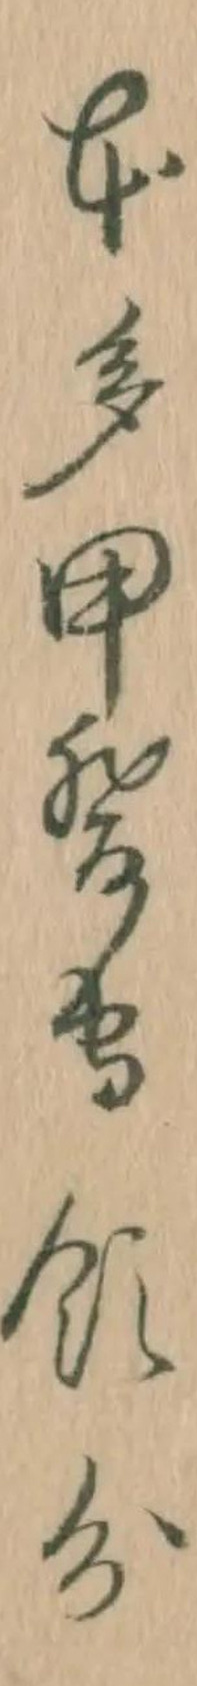宝本多甲斐守領分
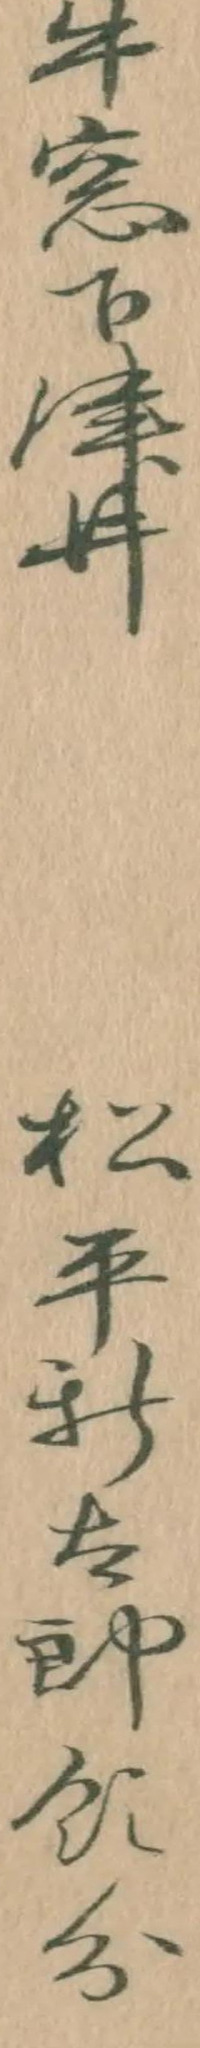牛窓下津井松平新太郎領分
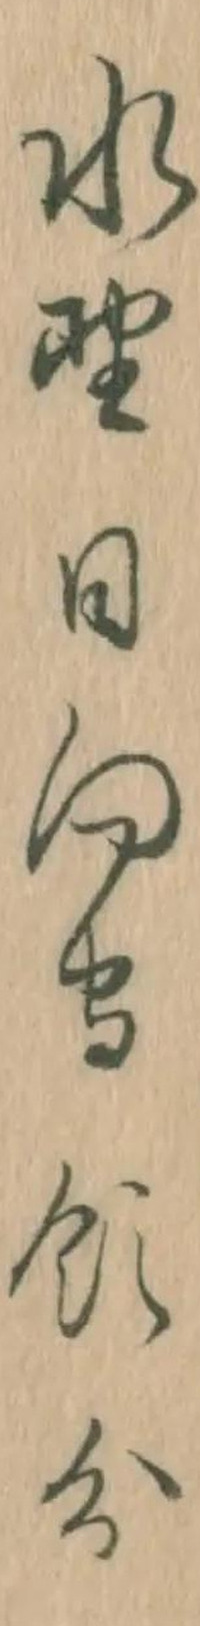鞆水野日向守領分

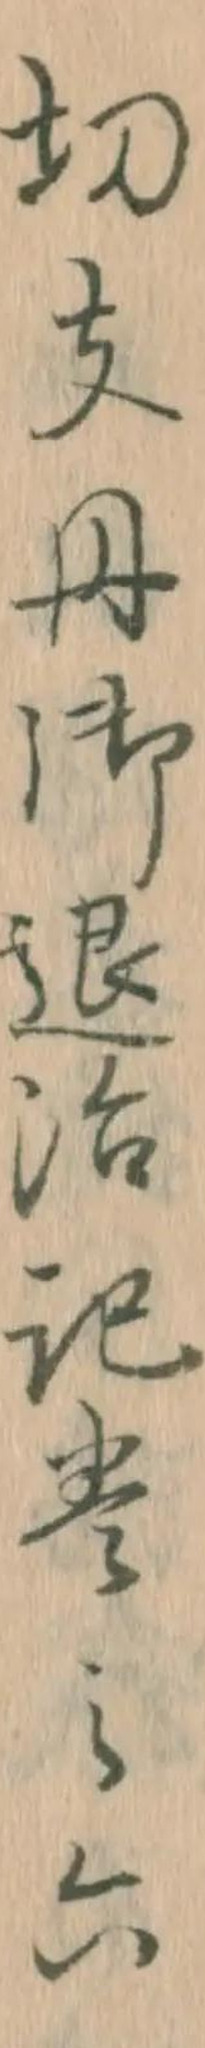切支丹御退治記巻之六
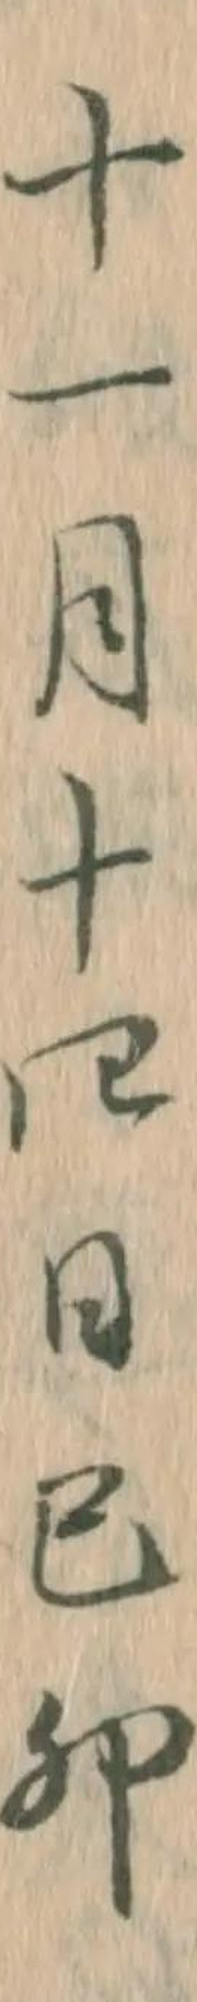十一月十四日己卯
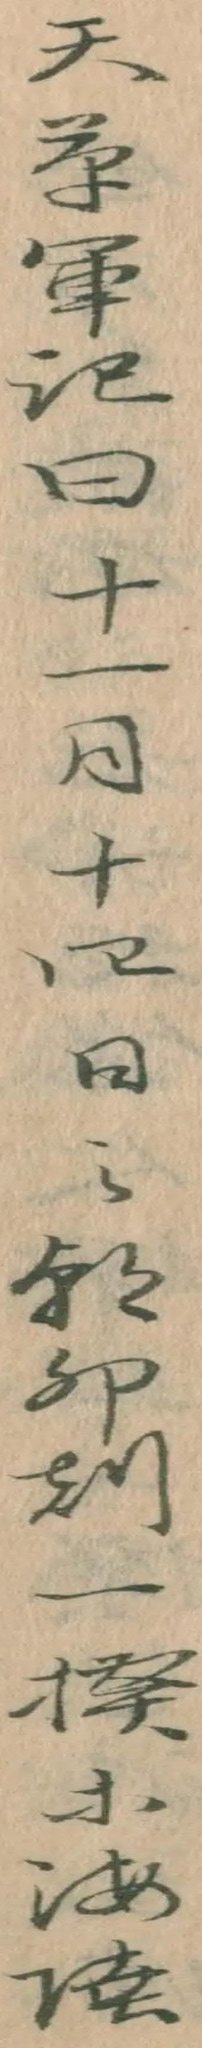天草軍記曰十一月十四日之朝卯刻一揆等海陸
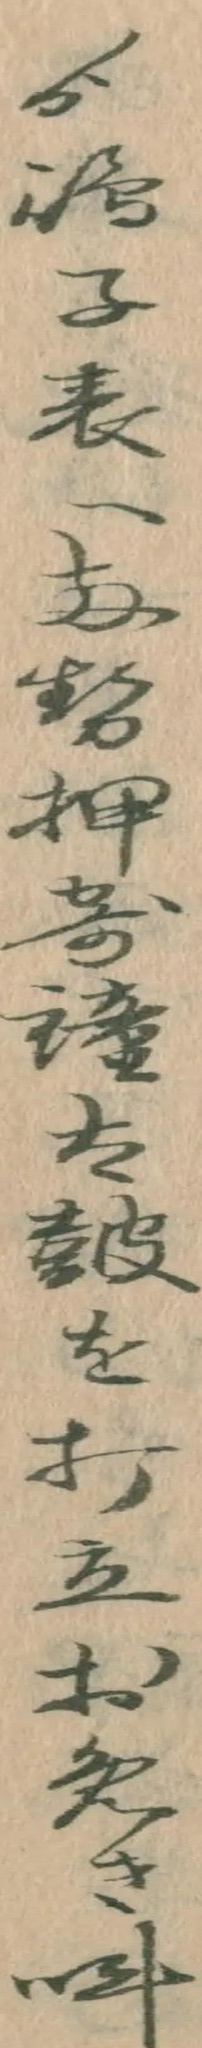ゟ島子表へ両勢押寄鐘太鼓を打立お免き叫
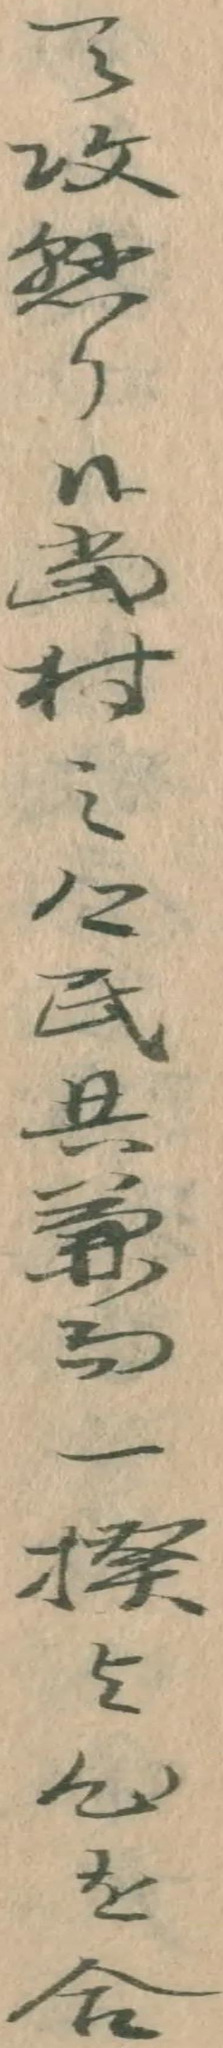て攻懸り候当村之郷民共兼而一揆与心を合
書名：切支丹御退治記 49巻. [2]
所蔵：国立国会図書館 National Diet Library, JAPAN
